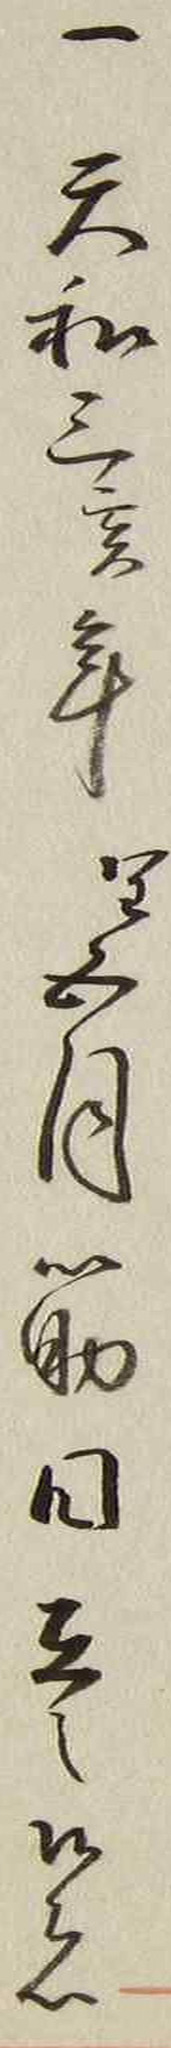一天和三亥年閏五月筋目有之候者
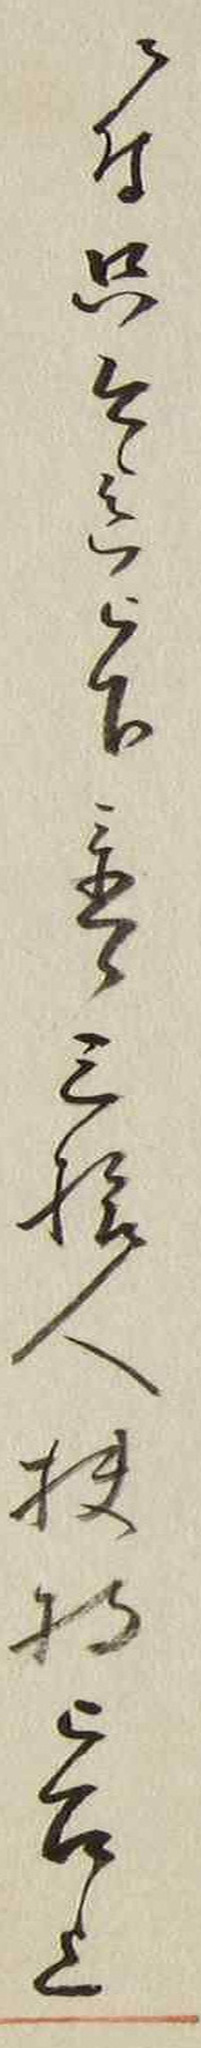に付只今迄被下置候三拾人扶知被召上
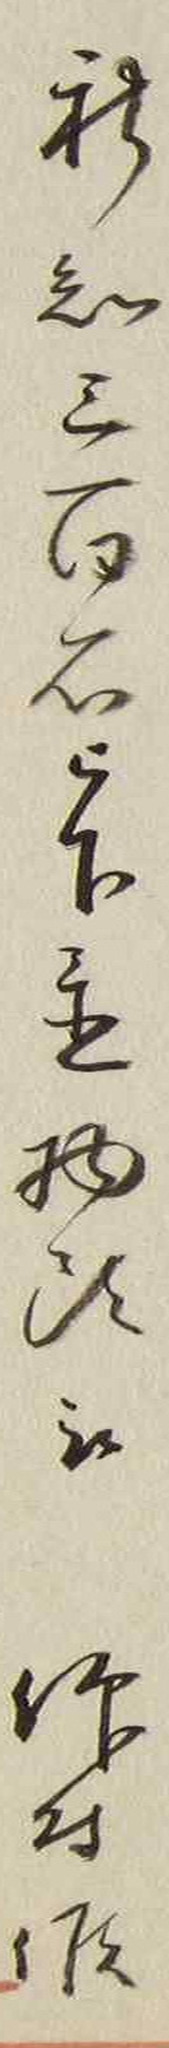新知三百石被下置物頭被仰付候

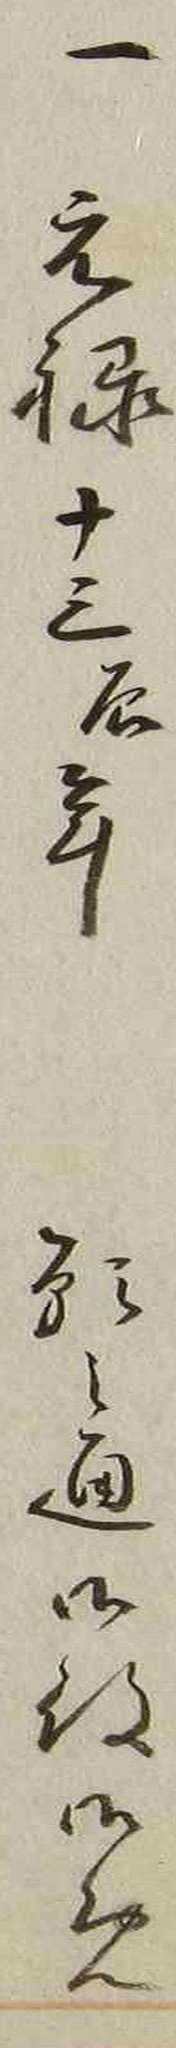一元禄十三辰年願之通御役御免
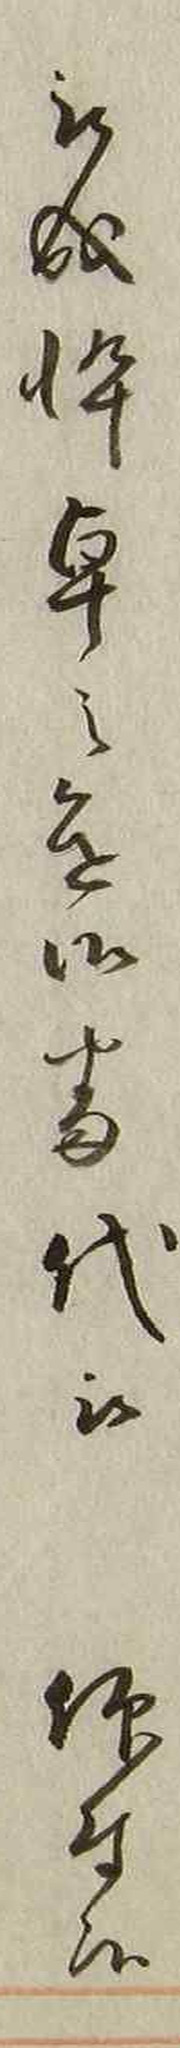被成忰卓之進御番代被仰付候
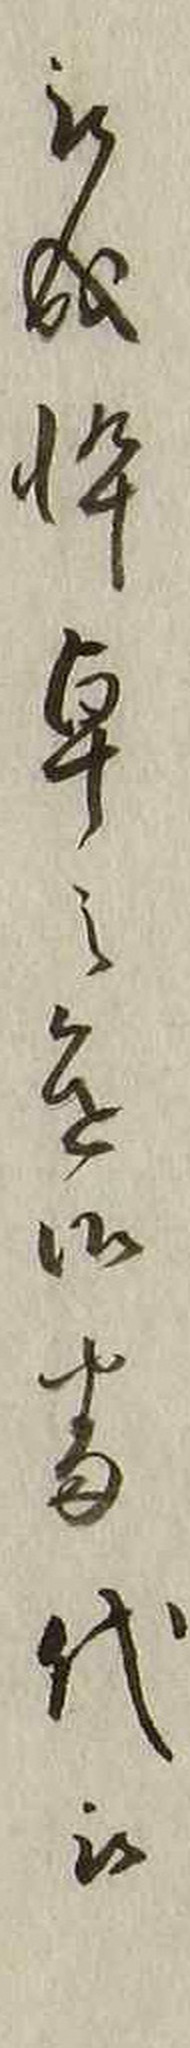被成忰卓之進御番代被仰付候
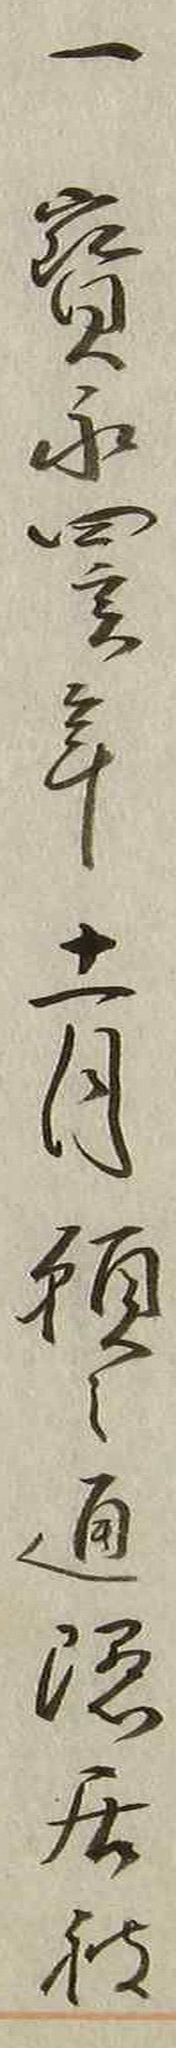一宝永四亥年土月願之通隠居被
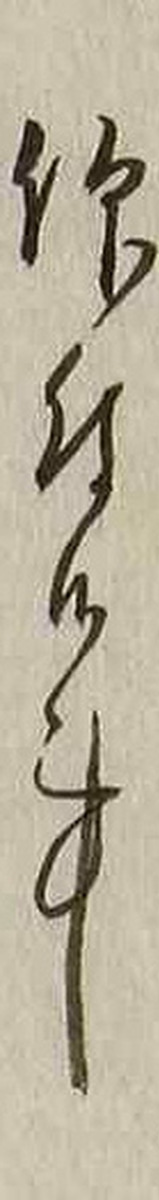仰付候事
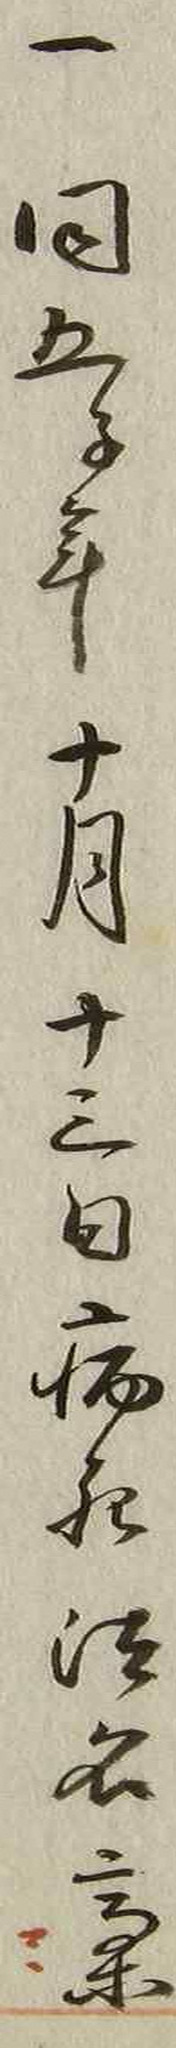一同五子年十月十三日病死法名稾
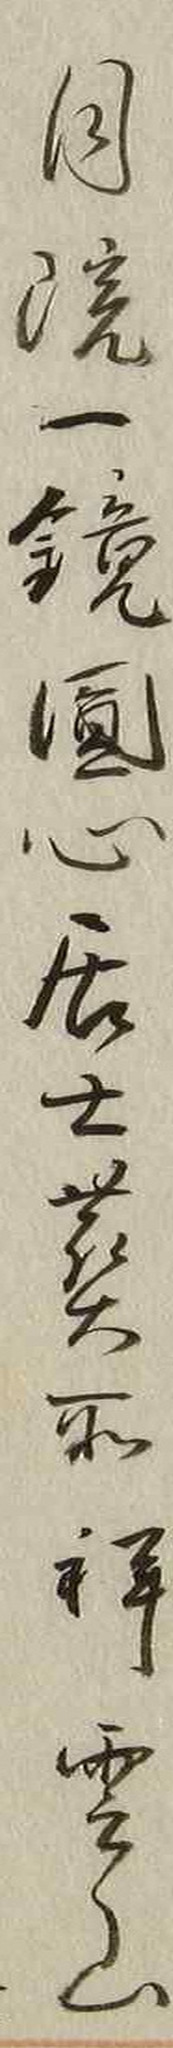月院一鏡円心居士葬所祥雲山善
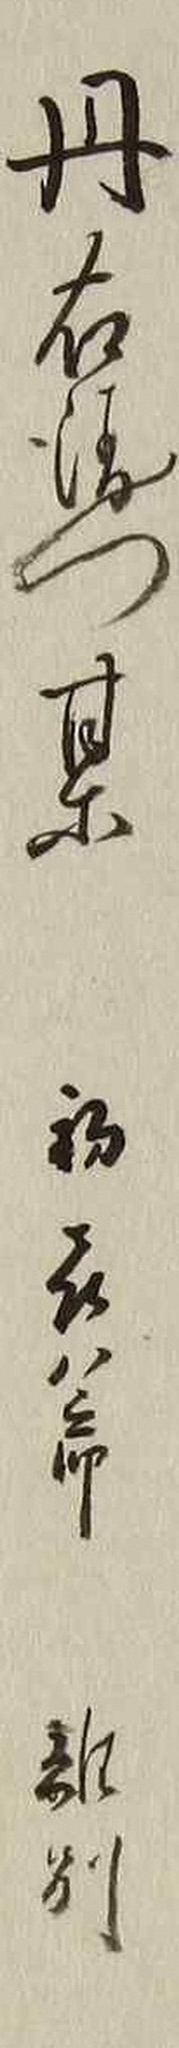丹右衛門某初次八郎離別
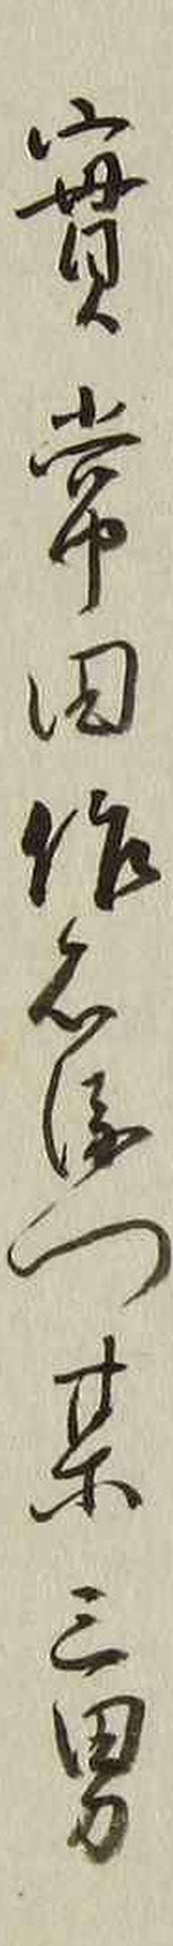実常田作左衛門某三男
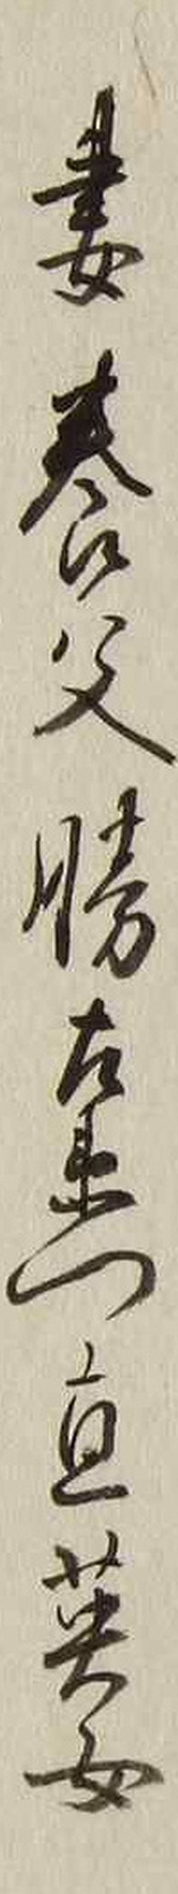妻養父勝左衛門直英女
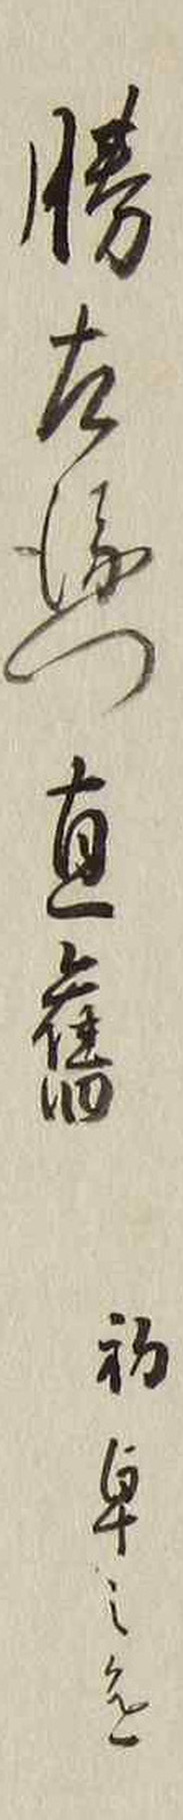勝左衛門直旧初卓之進
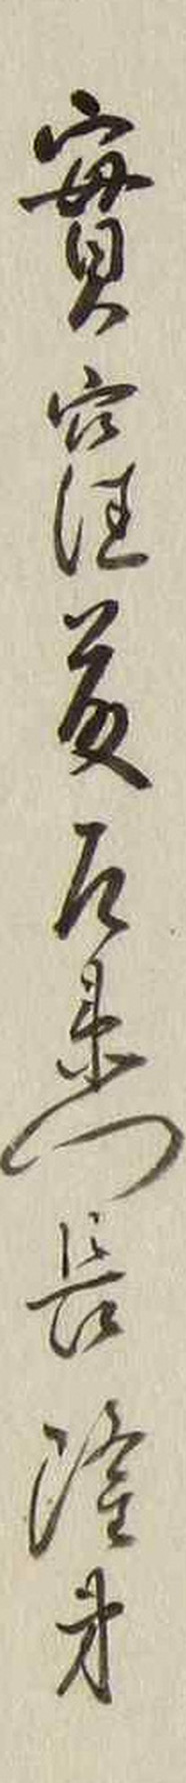実窪藤左衛門長淀弟

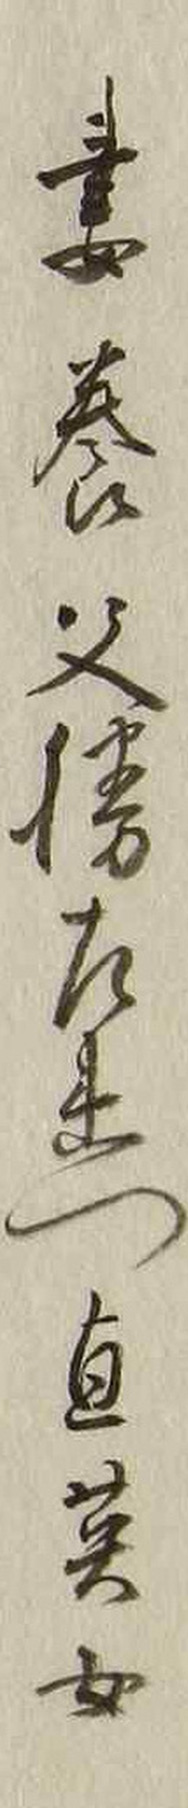妻養父勝左衛門直英女
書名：諸士系譜　巻之159　な之部1
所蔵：会津若松市立会津図書館
